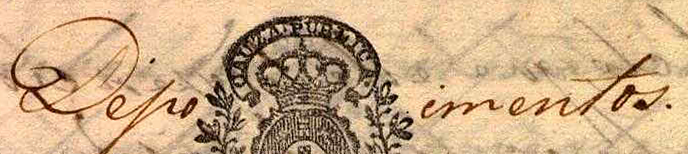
Depo imentos.
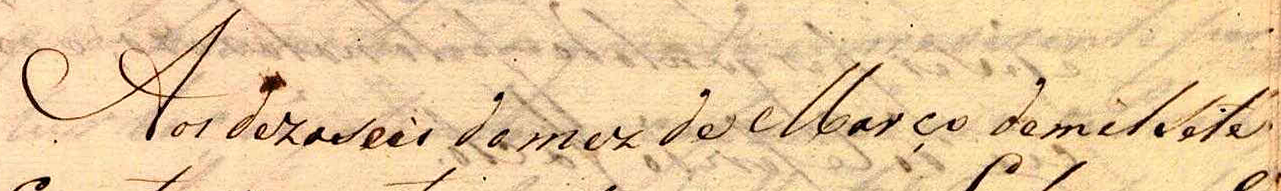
Aos dezaseis do mez de Março de mil Setes
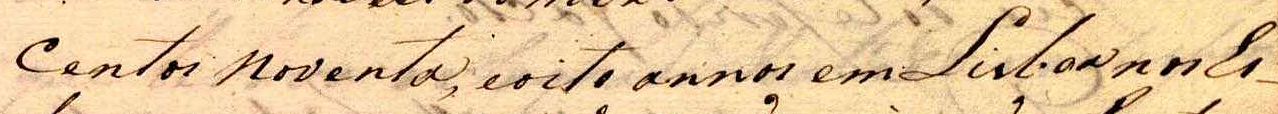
centos noventa, e oito annos em Lisboa nos Es
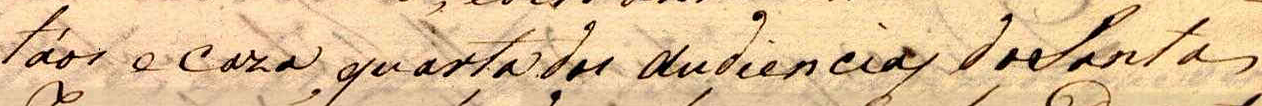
táos e caza quarta das audiencias da Santa
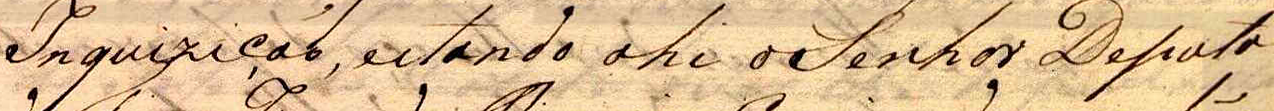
Inquiziçaõ, estando ahi o Senhor Deputa
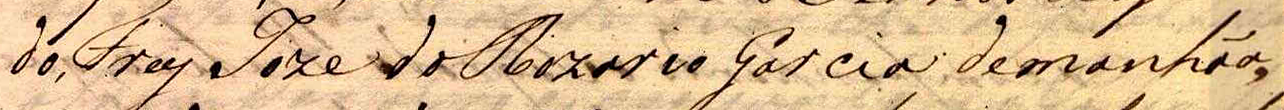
do, Frey Ioze do Rozario Garcia de manhãa,
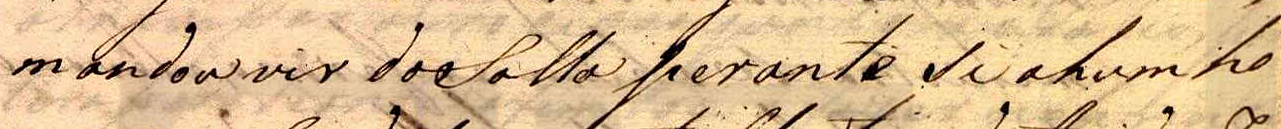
mandou vir da Salla perante si a hum ho
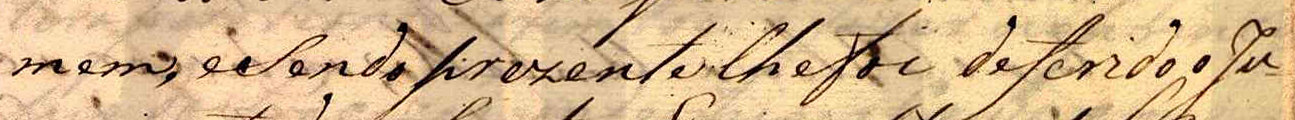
mem, e sendo prezente lhe foi deferido o Ju
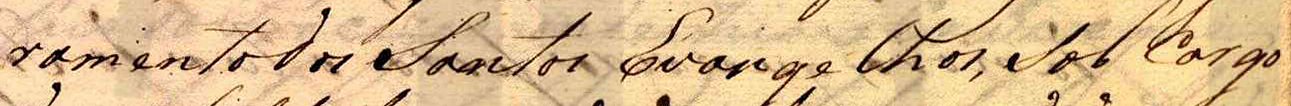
ramento dos Santos Evangelhos, sob cargo
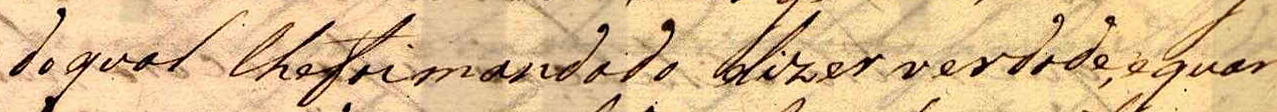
do qual lhe foi mandado dizer verdade, e guar
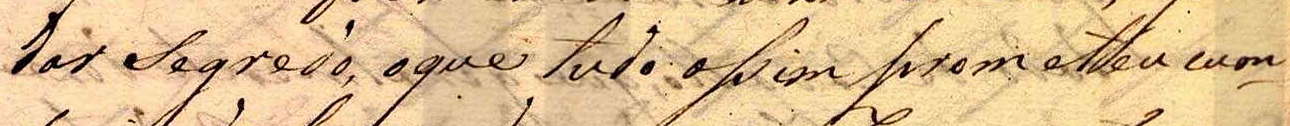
dar Segredo, o que tudo assim prometteu cum
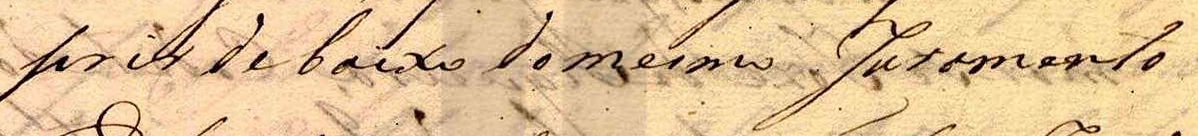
prir debaixo do mesmo Juramento
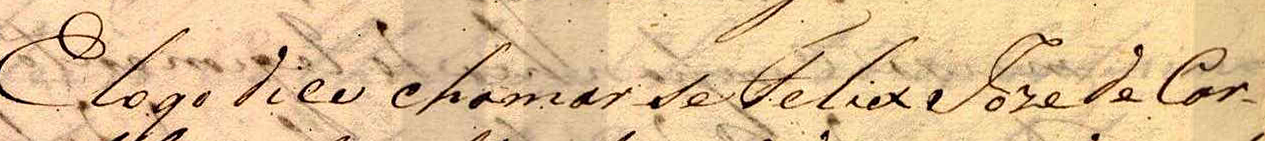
E logo dice chamar se Felix Ioze de Car
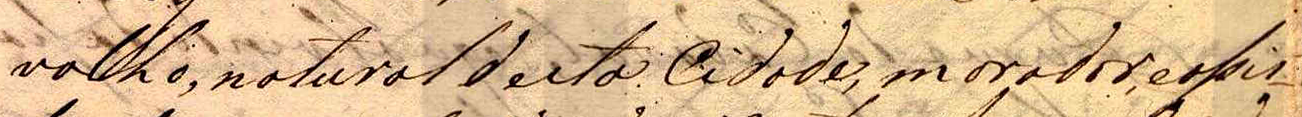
valho, natural desta Cidade, morador, e asis
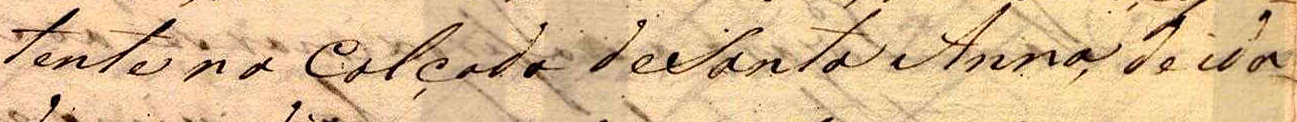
tente na Calçada de Santa Anna, de ida
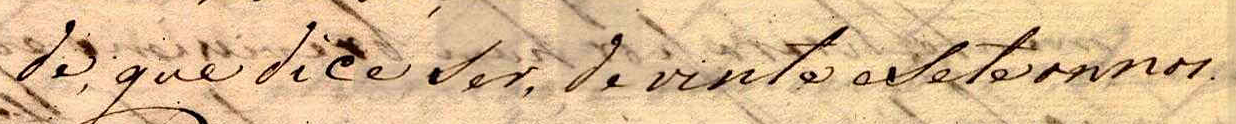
de, que dice ser, de vinte e sete annos.
